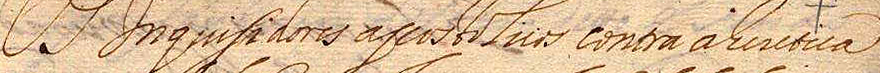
Os Inquisidores apostolicos contra a heretica
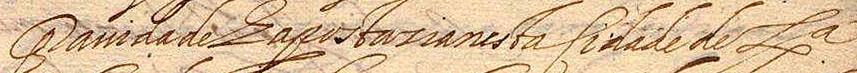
prauidade E apostazia nesta Cidade de Lx.a
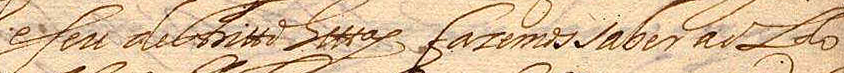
e seu destritto Etttaꝭ fazemos saber ao Ldo
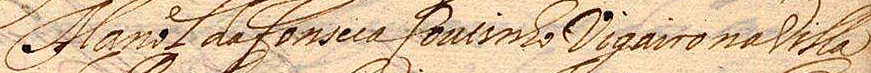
ManoeL da fonseca Coutinho Vigairo na Villa
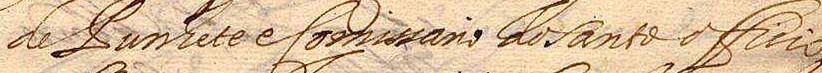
de Punhete e Comissario do santo officio
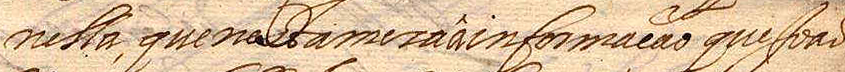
nella, que nesta meza â informação que Joaõ
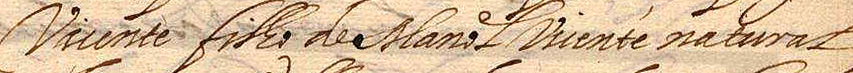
Vicente filho de ManoeL Vicente naturaL
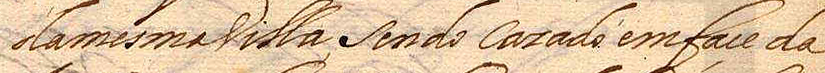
da mesma Villa, sendo cazado em façe da
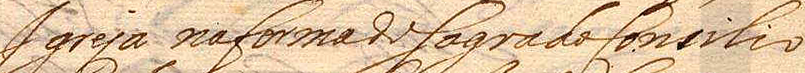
Jgreja na forma do Sagrado Concilio
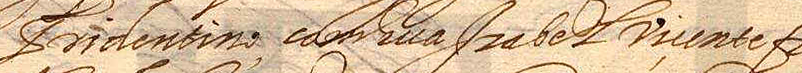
Tridentino com hua JsabeL Viçente fi
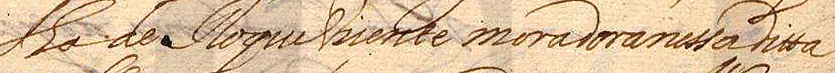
lha de Roque Viçente moradora nessa ditta
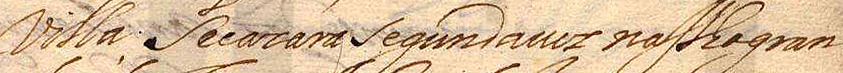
villa, se cazara segunda uez na Jlha gran
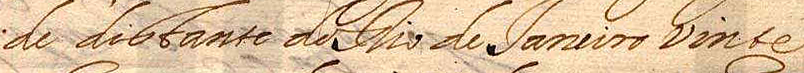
de distante de Rio de Janeiro vinte
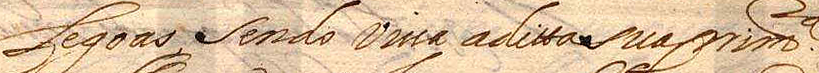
Legoas, sendo viua a ditta sua primra.
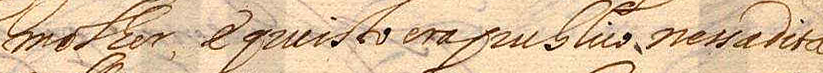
molher, E que isto era publico nessa ditta
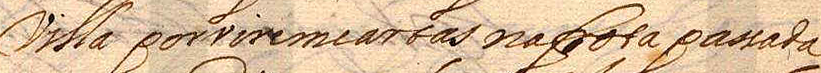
Villa por virem cartas na frota passada
